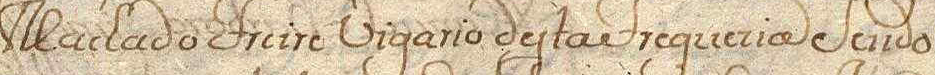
Machado Freire Vigario desta Freguezia Sendo
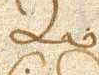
2a
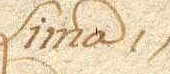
Lima//
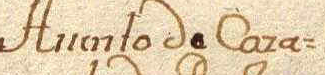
Assento do Caza
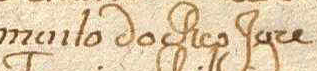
mento do Reo Joze
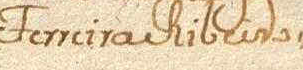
Ferreira Ribeiro
